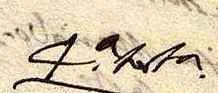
4.a testa.
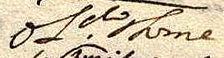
o L.do thome
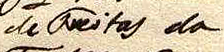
de Freitas da
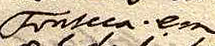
Fonseca. em
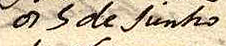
os 5 de Iunho
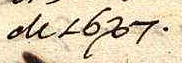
de 1687.
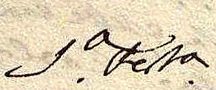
1a. Test.a
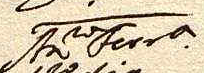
Anto Ferra.
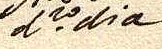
dt.o dia
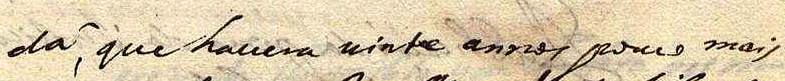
da, que hauera uinte annos pouco mais
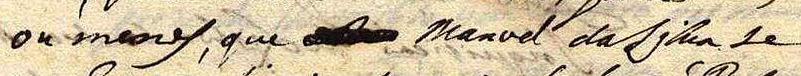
ou menos, que _ Manoel da Sjlua se
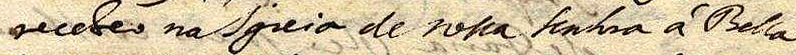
recebeo na Igreia de nossa Senhora á Bella
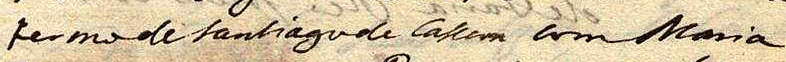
termo de santiago de Cassem com Maria
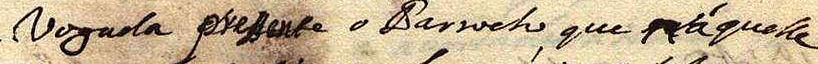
Vogada pressente o Parrocho, que náquelle
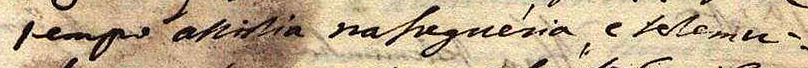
tempo assistia na freguezia, e tetemu
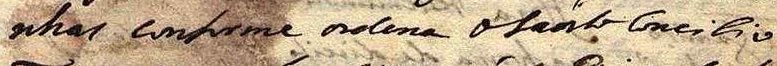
nhas conforme ordena o Santo Concilio
